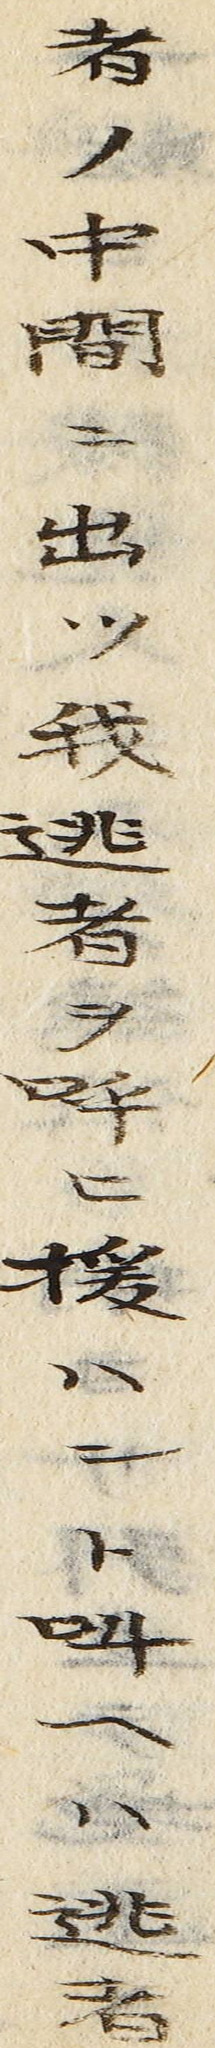者ノ中間ニ出ツ我逃者ヲ呼ヒ援ハント叫ヘハ逃者
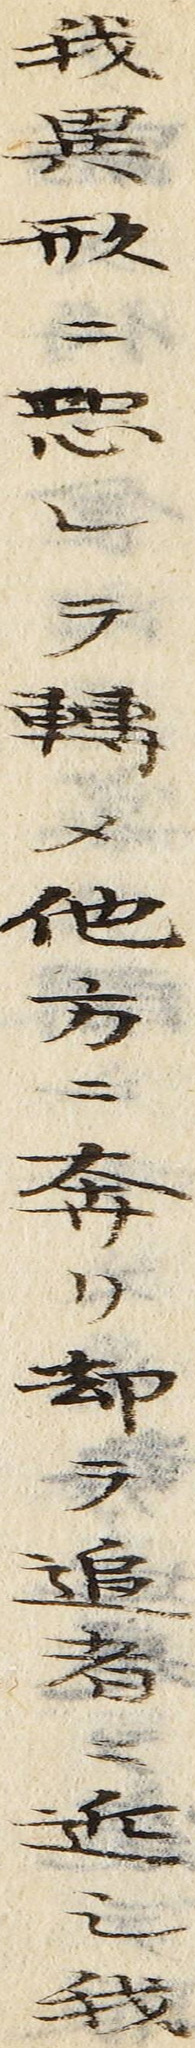我異形ニ恐レテ転シテ他方ニ奔リ却テ追者ニ近シ我
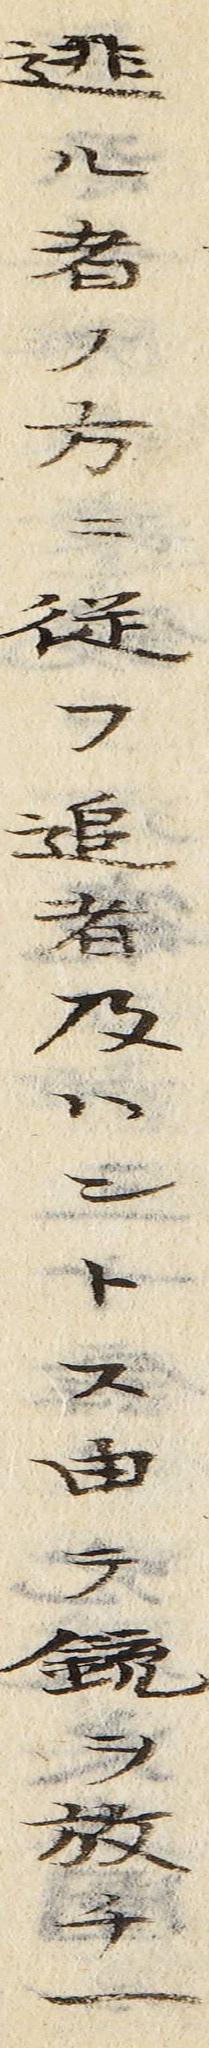逃ル者ノ方ニ従フ追者及ハントス由テ銃ヲ放チ一
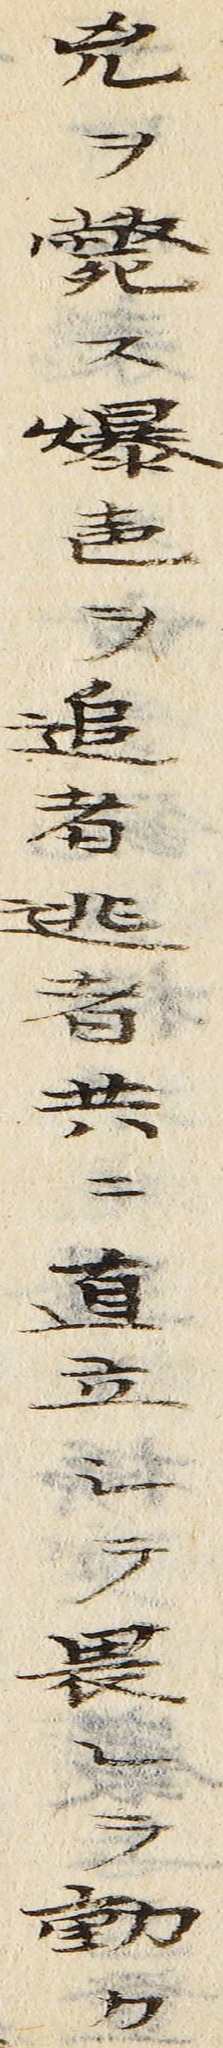兇ヲ斃ス爆声ヲ追者逃者共ニ直立シテ畏レテ動カ
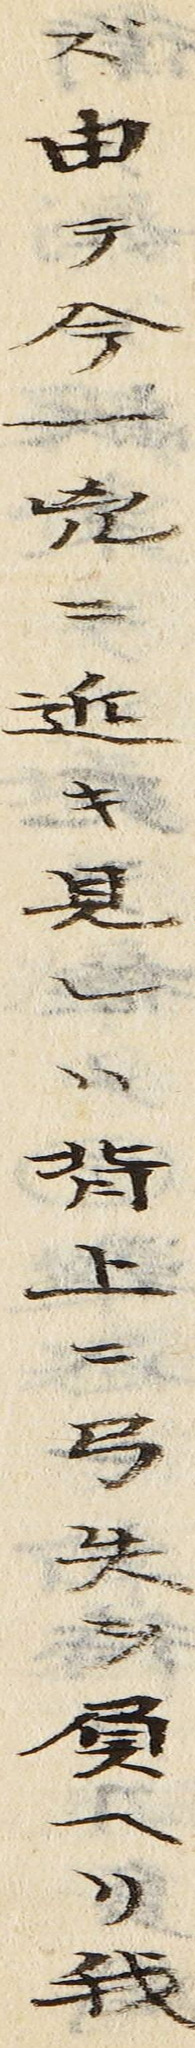ズ由テ今一兇ニ近キ見レハ背上ニ弓矢ヲ負ヘリ我
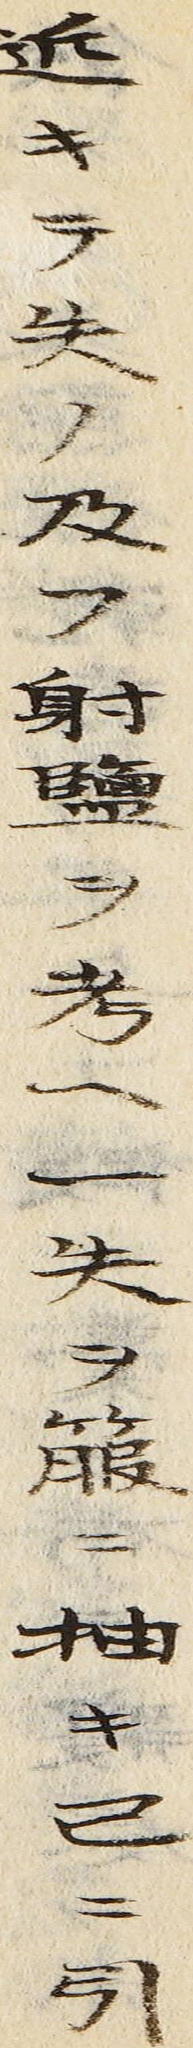近キテ矢ノ及フ射鹽ヲ考ヘ一矢ヲ箙ニ抽キ已ニ引
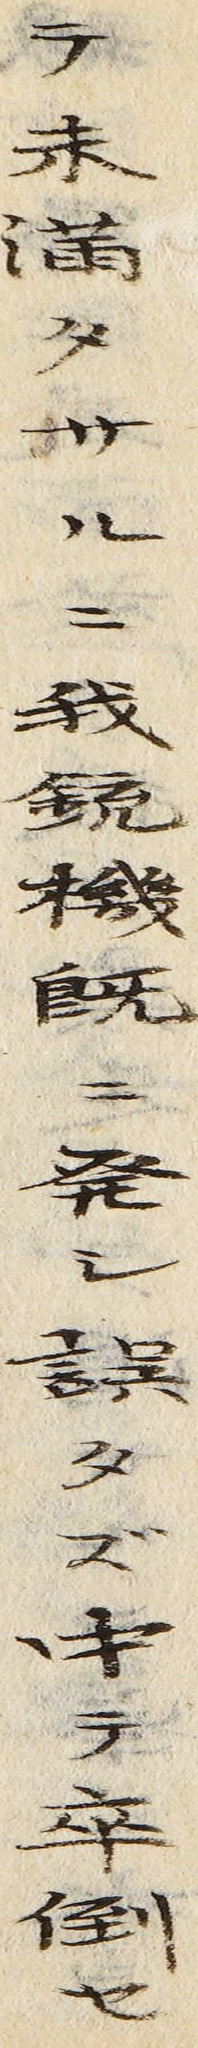テ未満タサルニ我銃機既ニ発シ誤タズ中テ卒倒セ
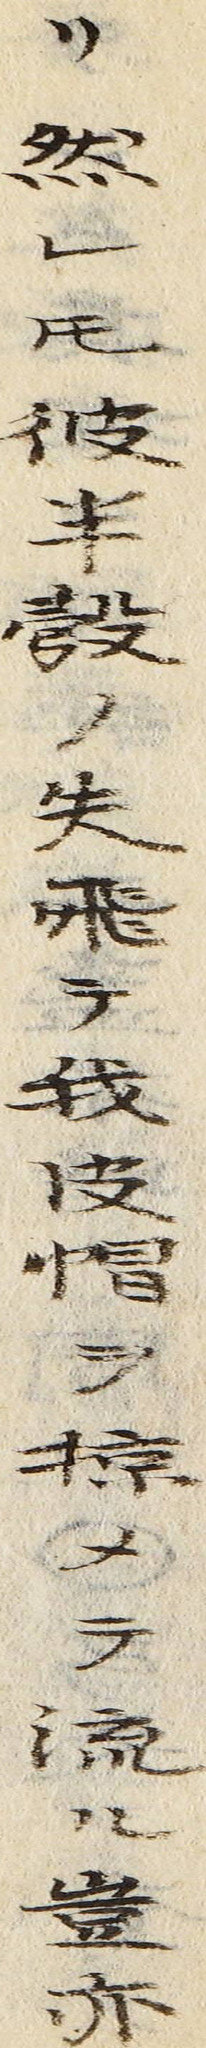リ然レトモ彼半彀ノ矢飛テ我皮帽ヲ掠メテ流ル豈亦
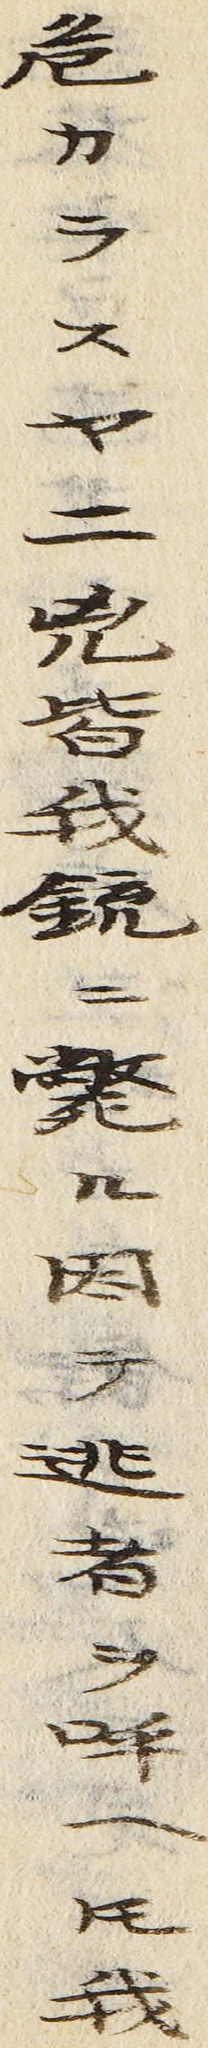危カラスヤ二兇皆我銃ニ斃ル因テ逃者ヲ呼ヘトモ我
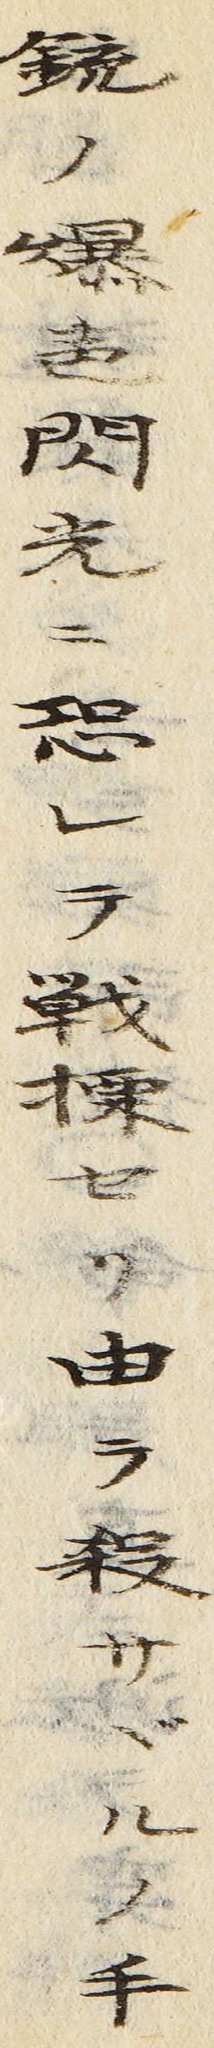銃ノ爆声閃光ニ恐レテ戦慄セリ由テ殺サヾルノ手
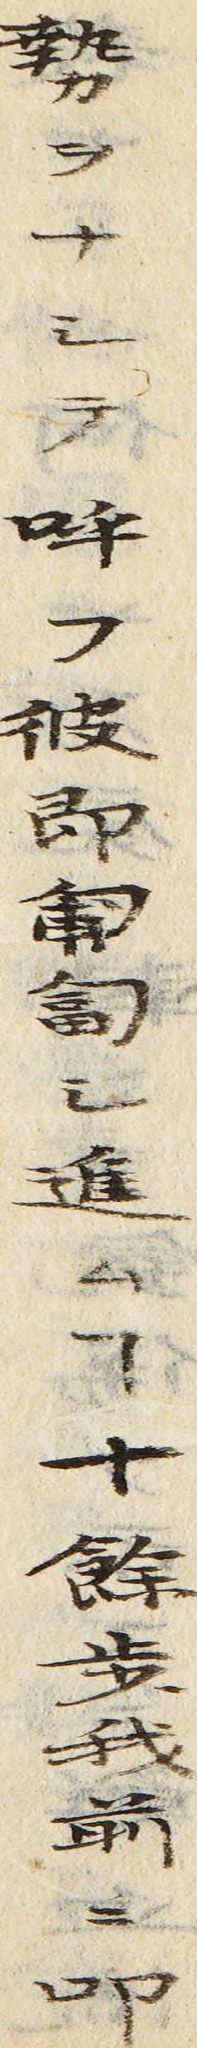勢ヲナシテ呼フ彼即匍匐シ進ムコト十余歩我前ニ叩
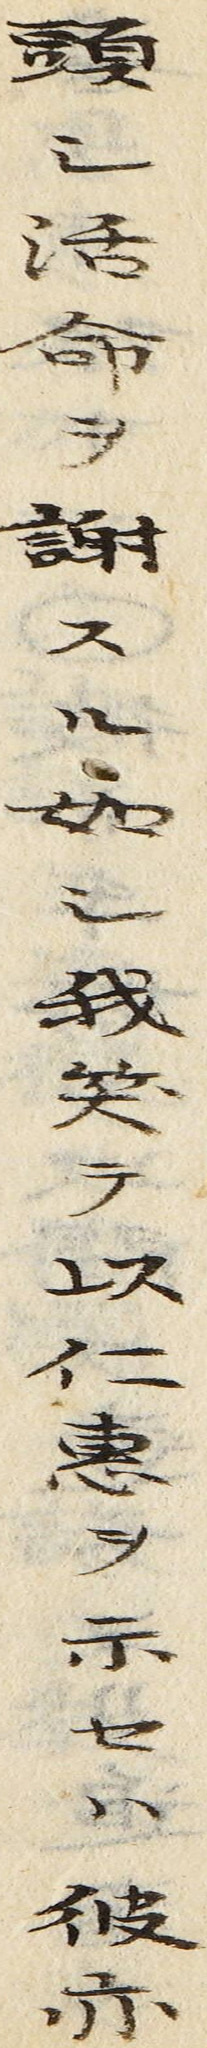頭シ活命ヲ謝スル如シ我笑テ以仁恵ヲ示セハ彼亦
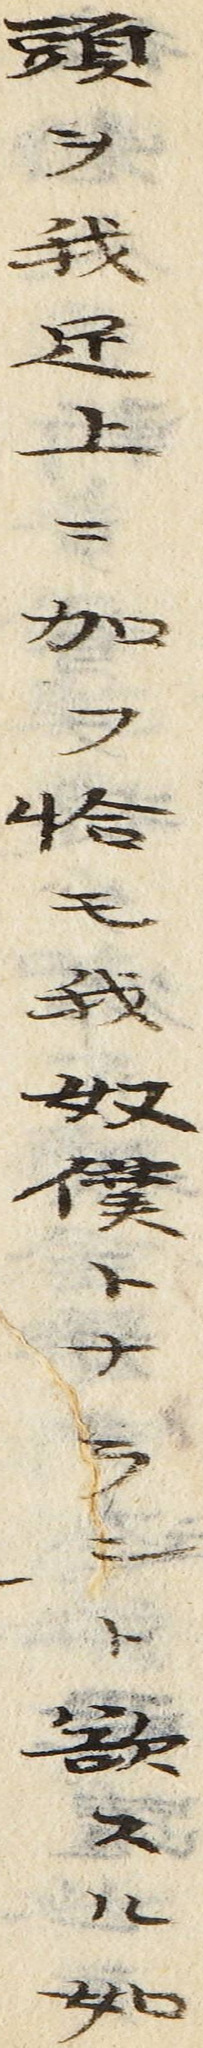頭ヲ我足上ニ加フ恰モ我奴僕トナラント欲スル如
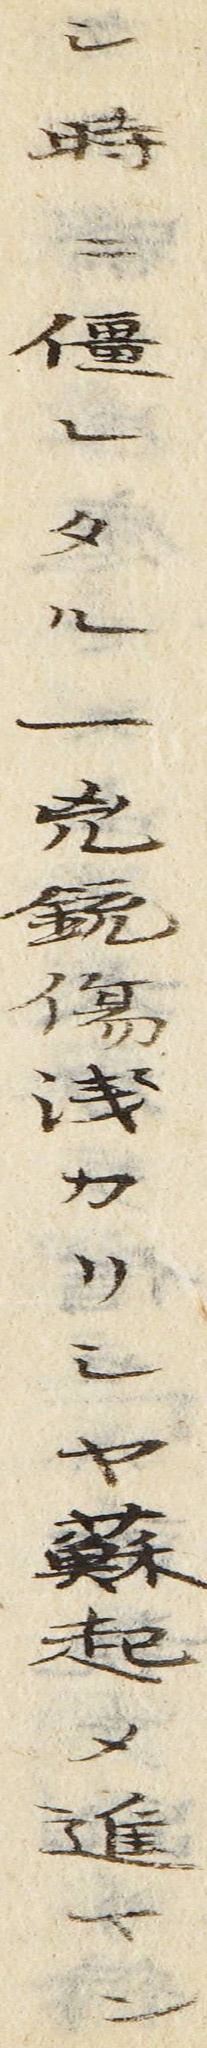シ時に僵レタル一兇銃傷浅カリシヤ蘇起シテ進マン
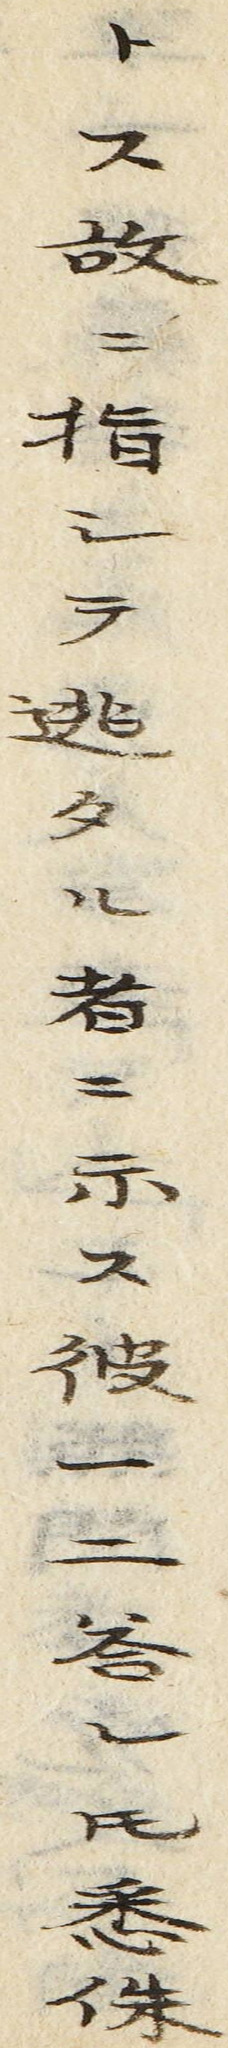トス故ニ指シテ逃タル者ニ示ス彼一二答レトモ悉侏
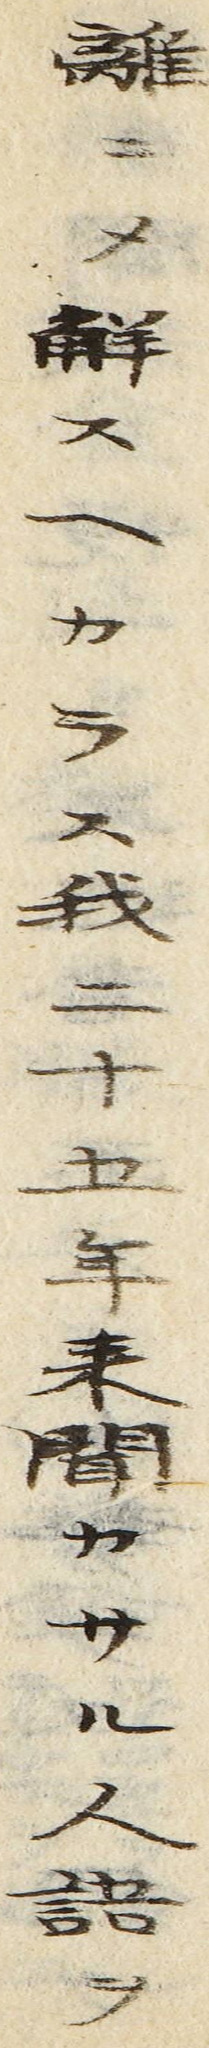離ニシテ解スヘカラス我二十五年来聞カサル人語ヲ
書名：漂流紀事
